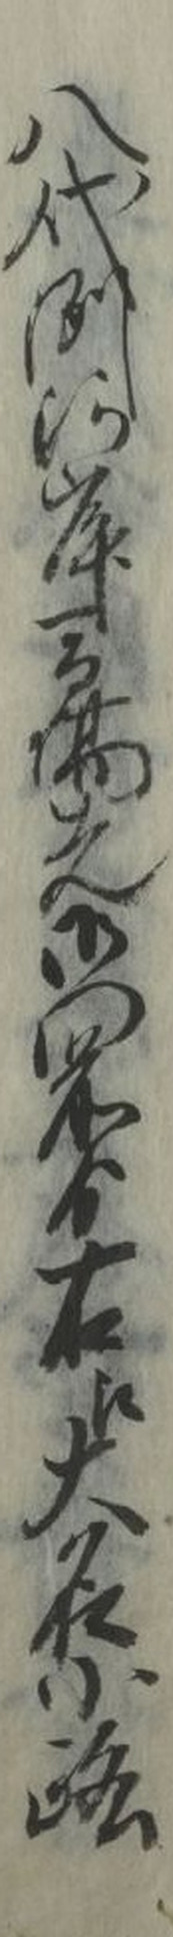八代洲河岸馬場先御門前ゟ右え大名小路
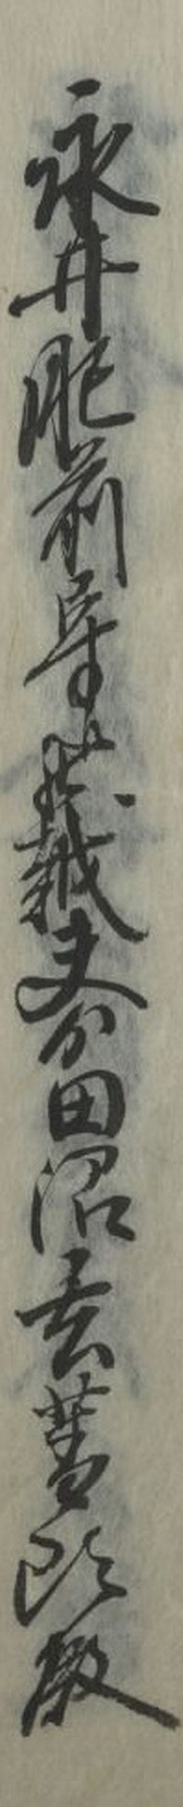永井肥前守え罷越夫ゟ田沼玄蕃頭殿

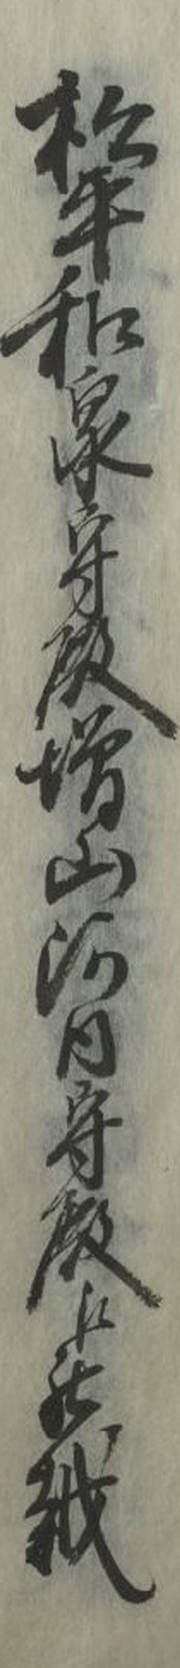松平和泉守殿増山河内守殿え罷越
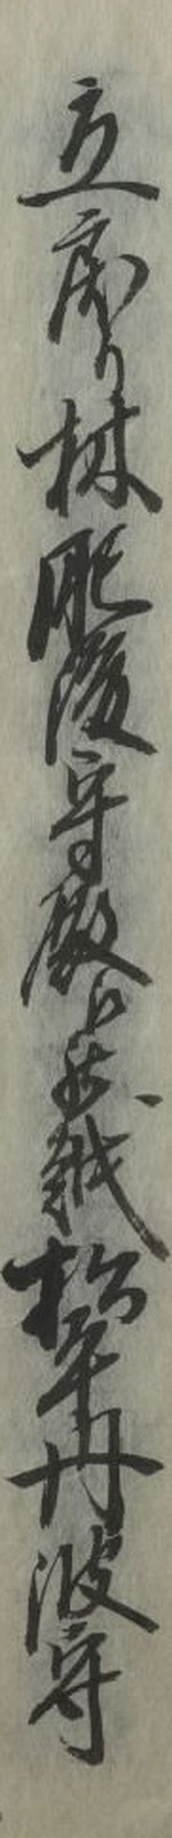立戻り林肥後守殿え罷越松平丹波守
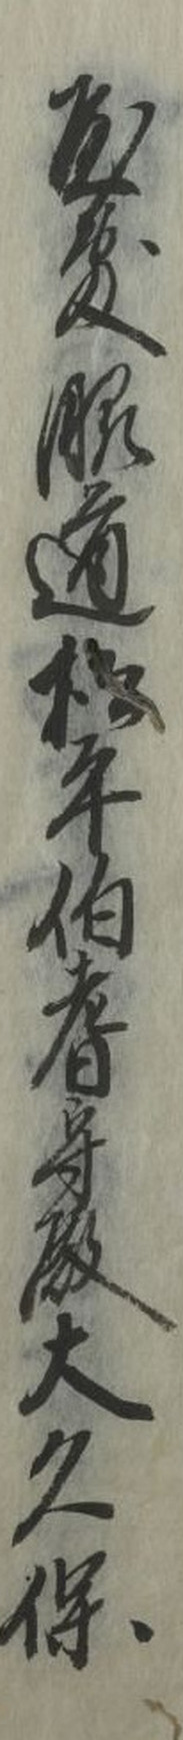屋敷脇道松平伯耆守殿大久保
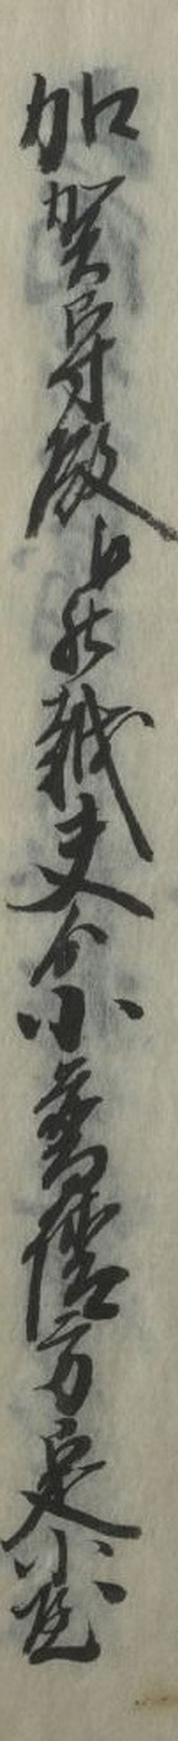加賀守殿え罷越夫ゟ小普請方定小屋
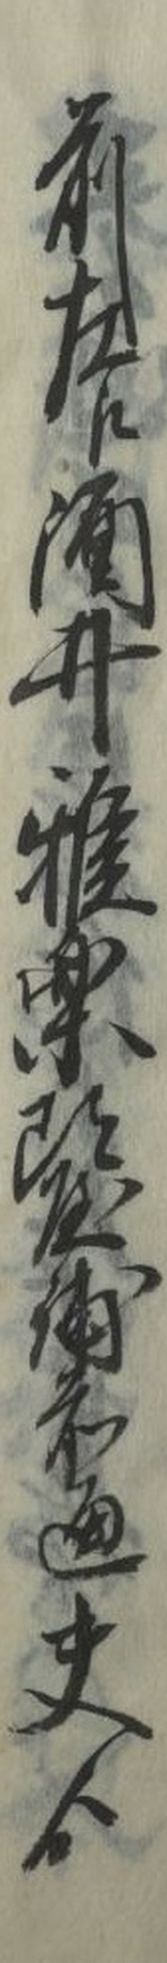前左え酒井雅楽頭屋鋪前通夫ゟ
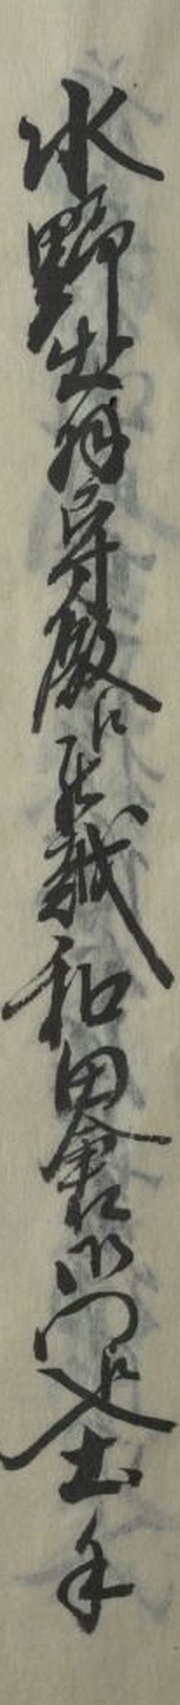水野出羽守殿え罷越和田倉御門え入土手
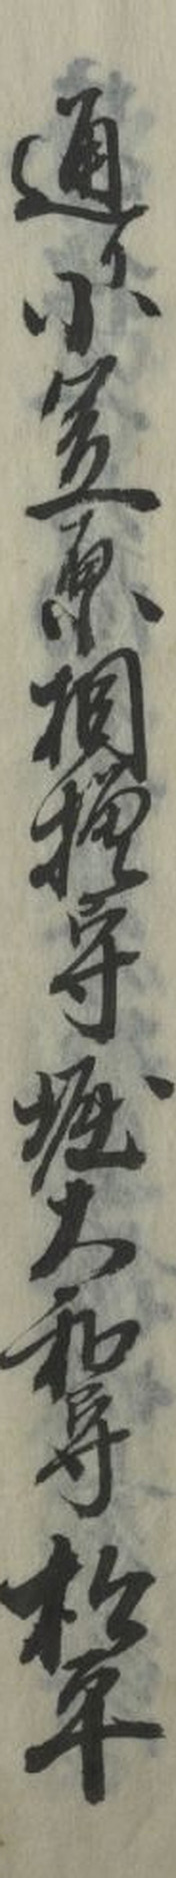通り小笠原相模守堀大和守松平
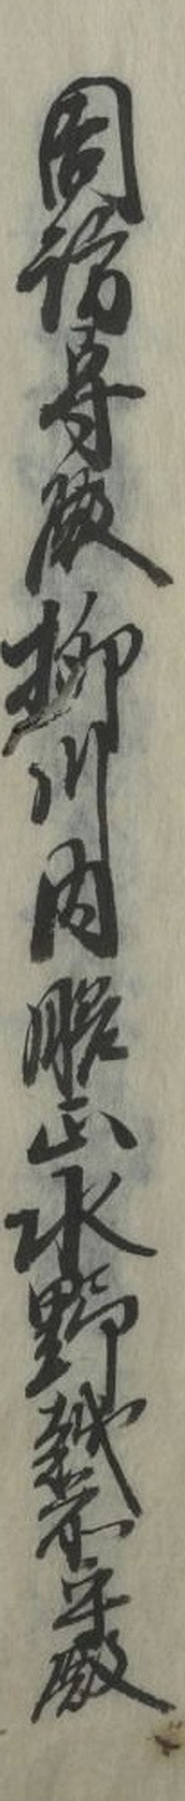周防守殿柳川内膳正水野越前守殿
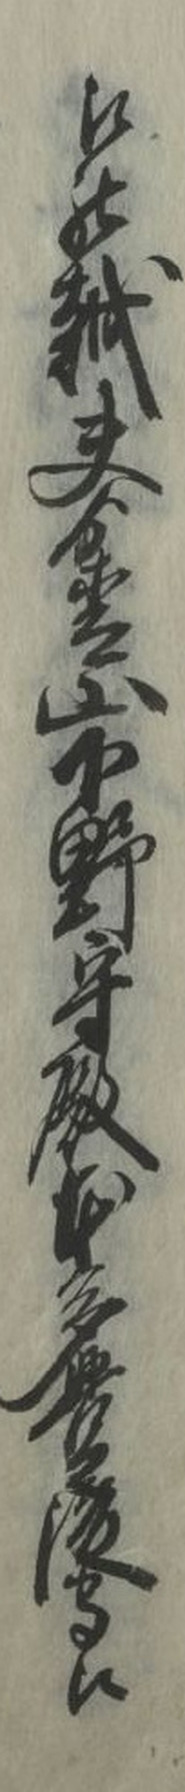え罷越夫ゟ松山下野守殿本多豊後守え
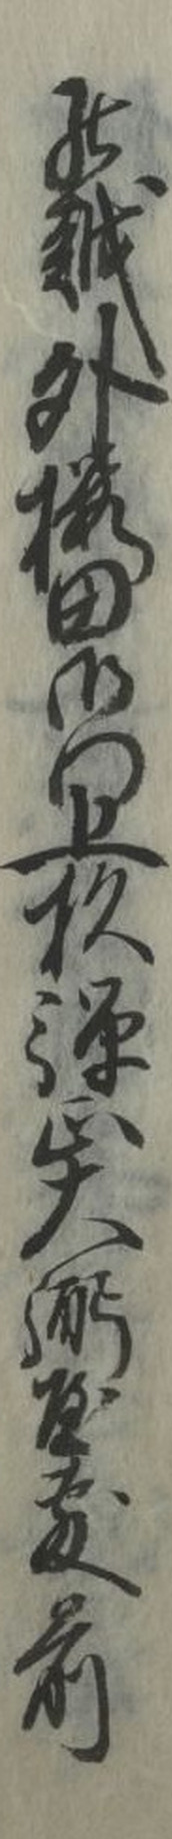罷越外桜田御門上杉弾正大弼屋敷前

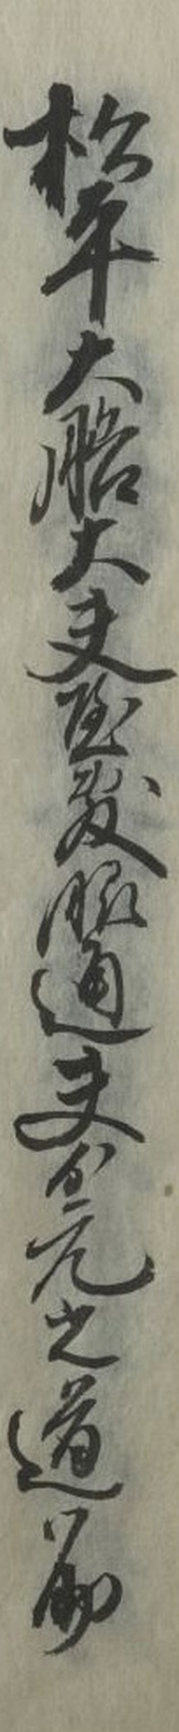松平大膳大夫屋敷脇通夫ゟ元之道筋
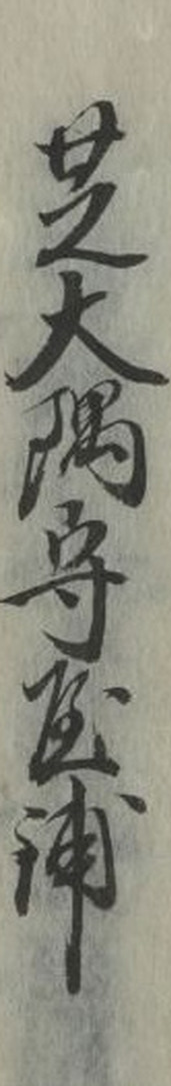芝大隅守屋鋪
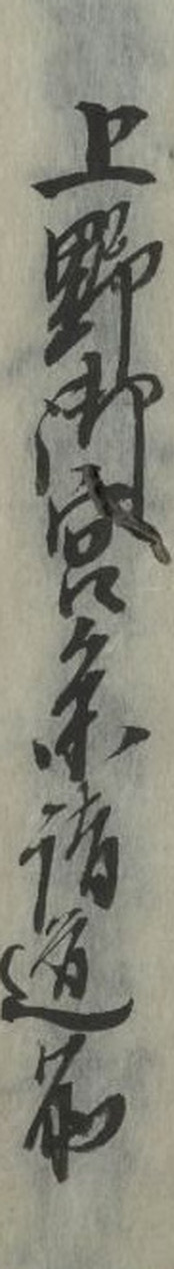上野御宮参詣道筋
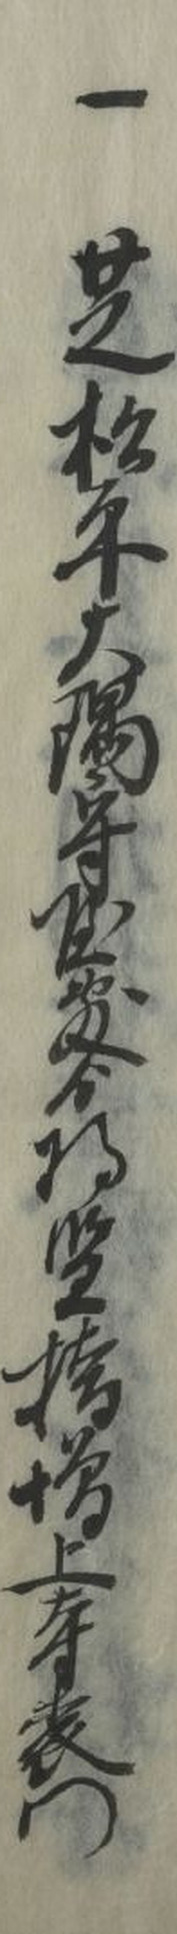一芝松平大隅守屋敷ゟ将監橋増上寺表門
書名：天保三壬辰年・琉球人参府・弐朱吹立御触写
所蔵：University of the Ryukyus Library
